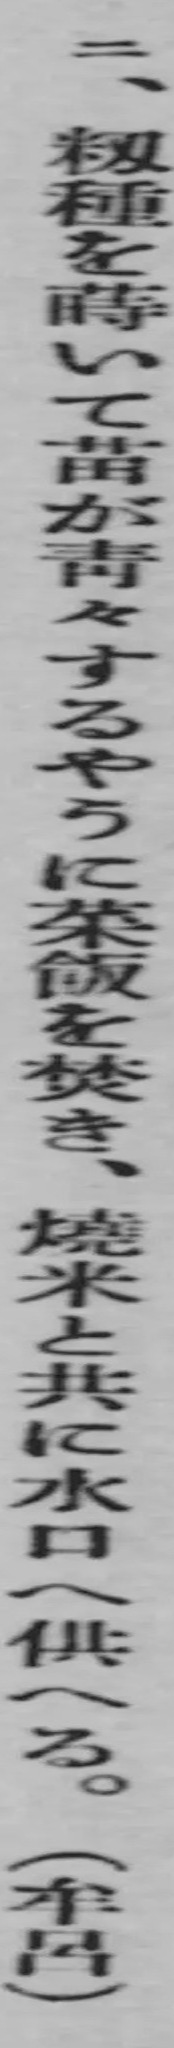ニ、籾種を蒔いて苗が靑々するやうに菜飯を焚き、燒米と共に水口へ供へる。(牟呂)
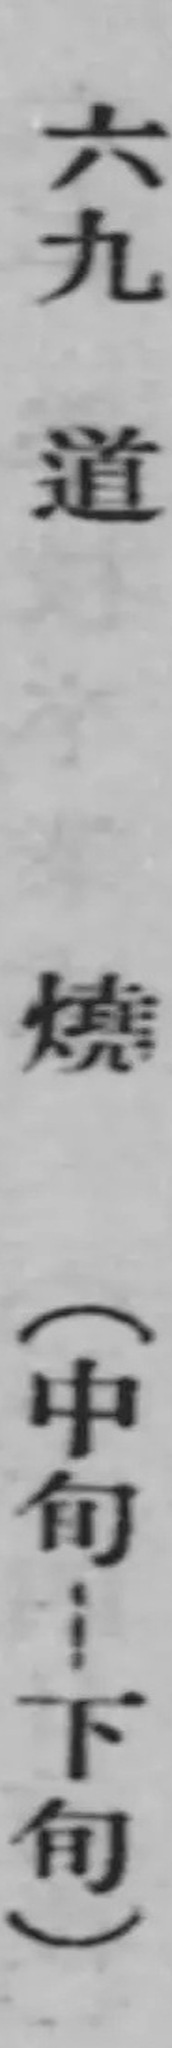六九道燒(中旬－下旬)
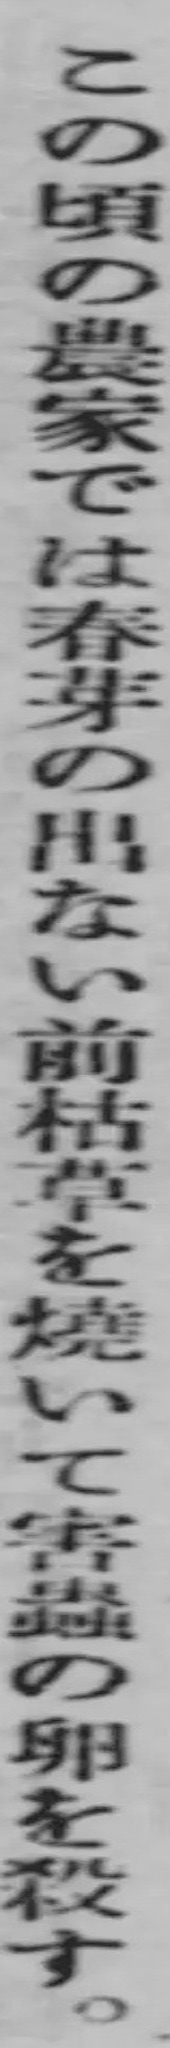この頃の農家では春芽の出ない前枯草を燒いて害蟲の卵を殺す。
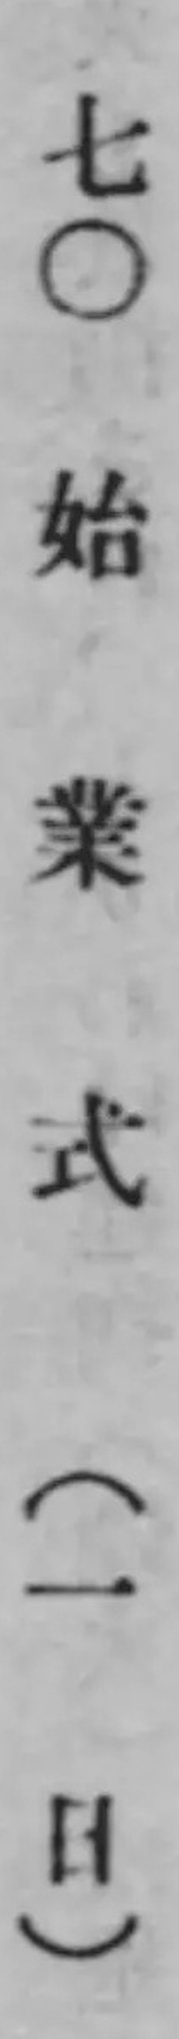七〇始業式(一日)
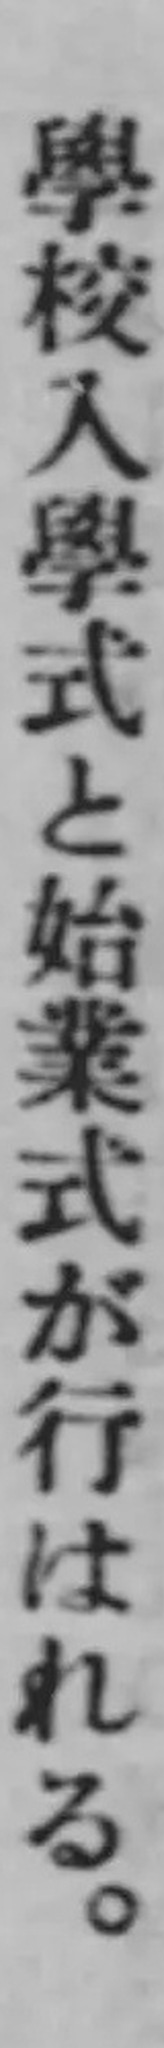學校入學式と始業式が行はれる。
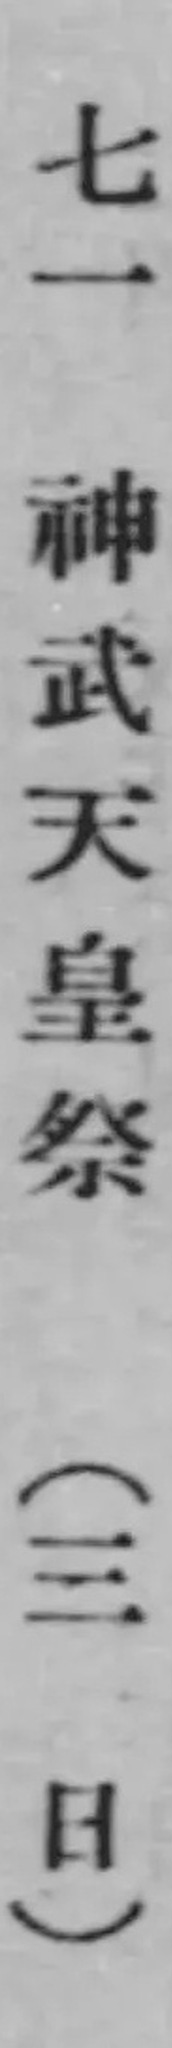七一神武天皇祭(三日)
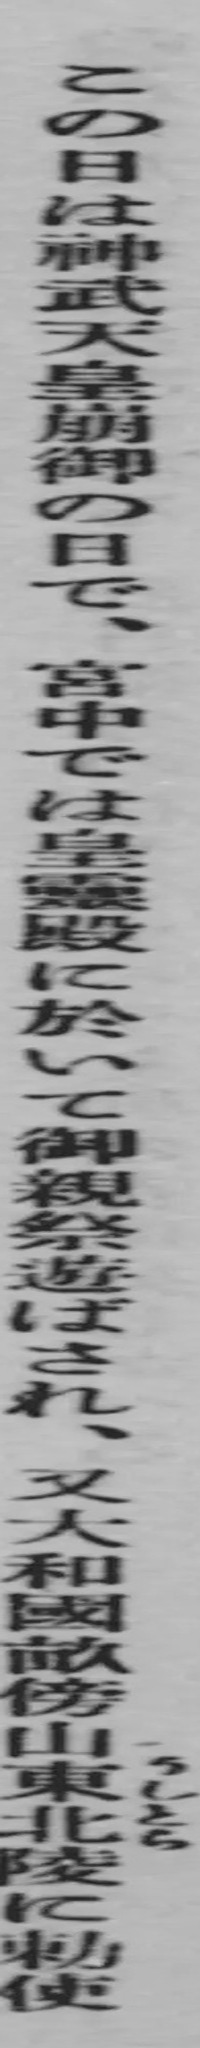この日は神武天皇崩御の日で、宮中では皇靈殿に於いて御親祭遊ばされ、又大和國畝傍山東北陵に勅使
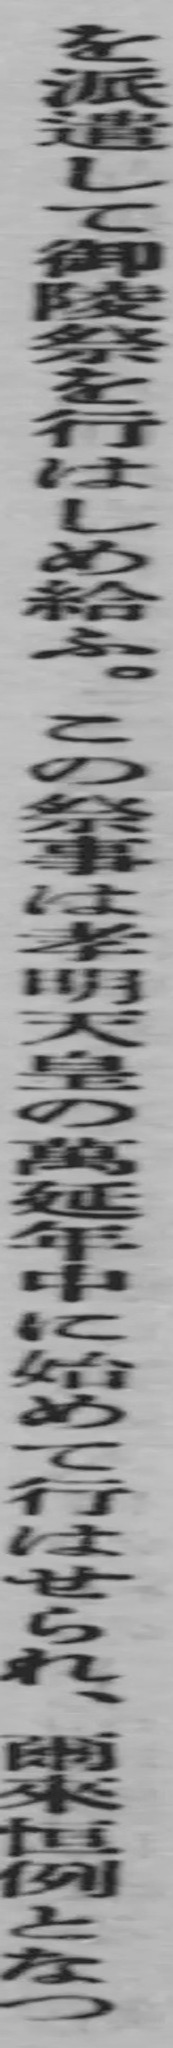を派遣して御陵祭を行はしめ給ふ。この祭事は孝明天皇の萬延年中に始めて行はせられ、爾來恒例となつ
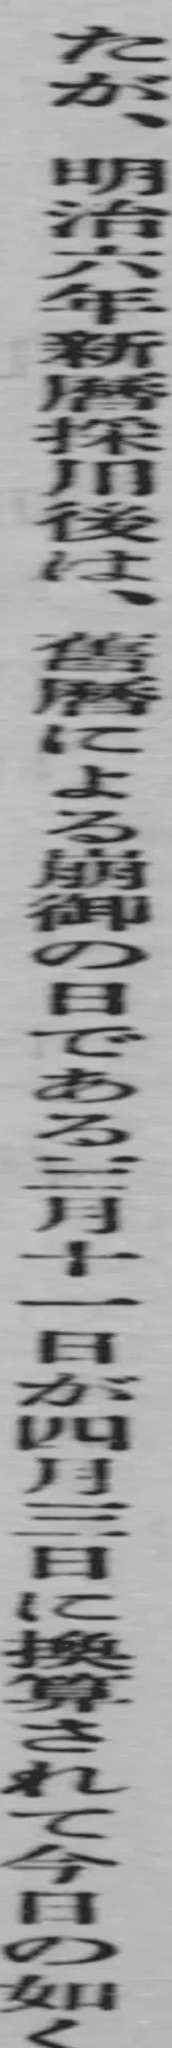たが、明治六年新曆採用後は、舊曆による崩御の日である三月十一日が四月三日に換算されて今日の如く
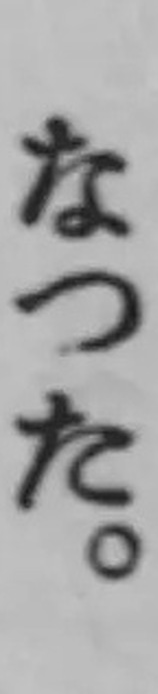なつた。
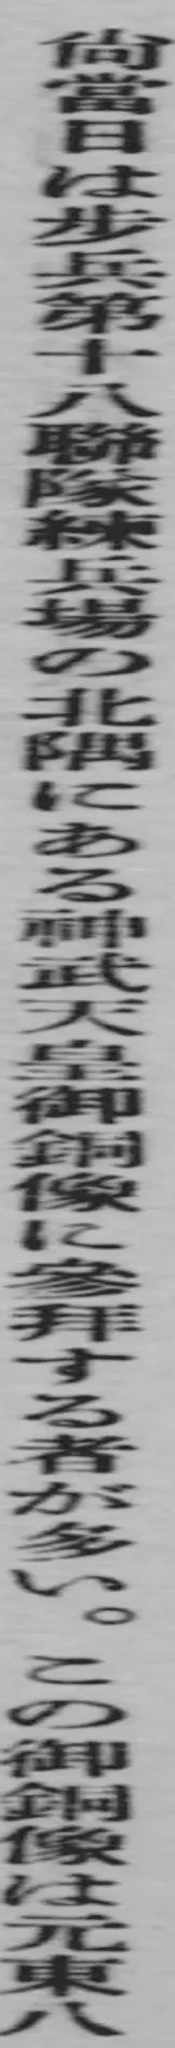尚當日は歩兵第十八聯隊練兵場の北隅にある神武天皇御銅像に參拜する者が多い。この御銅像は元東八
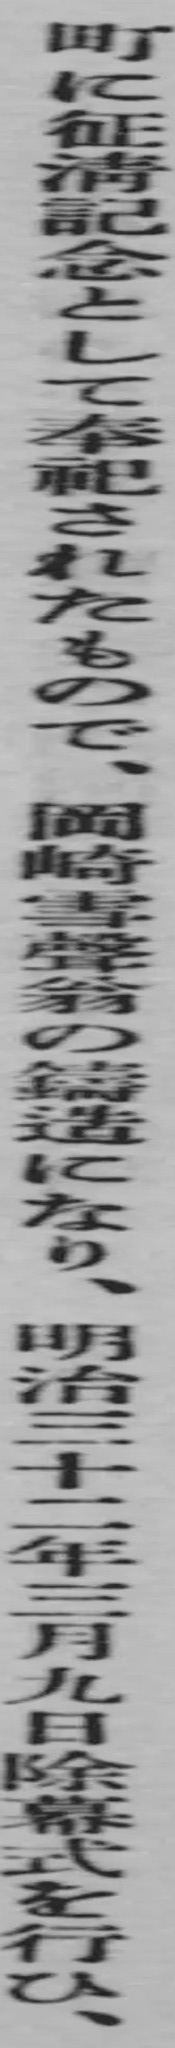町に征淸記念として奉祀されたもので、岡崎雪聲翁の鑄造になり、明治三十二年三月九日除幕式を行ひ、
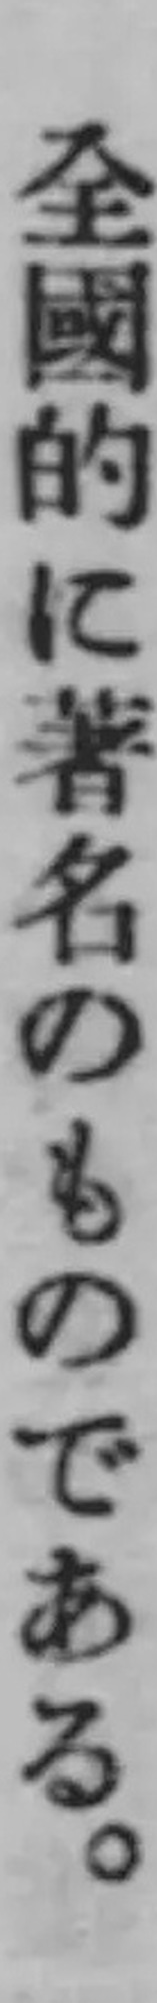全國的に著名のものである。
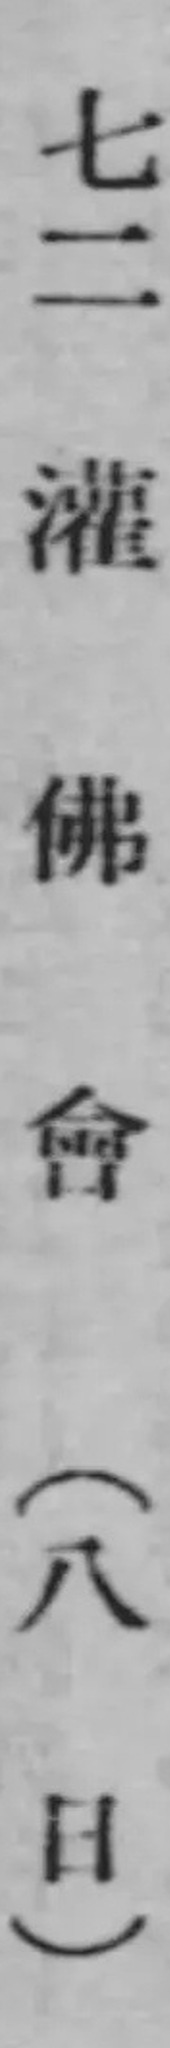七二灌佛會(八日)
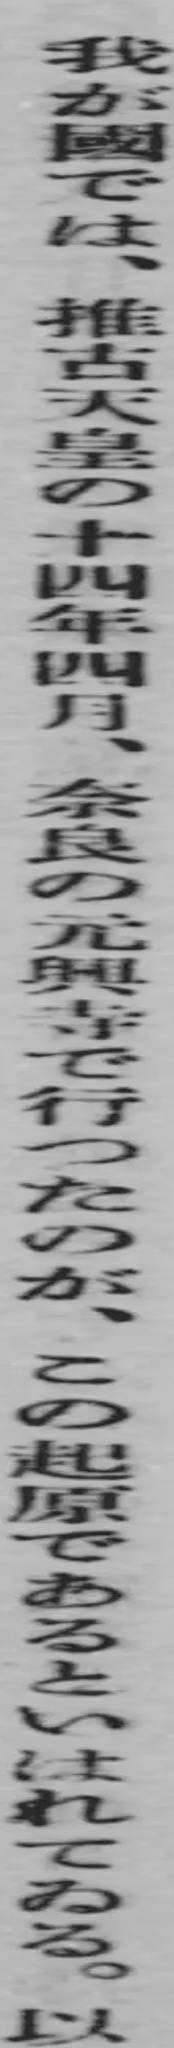我が國では、推古天皇の十四年四月、奈良の元興寺で行つたのが、この起原であるといはれてゐる。以
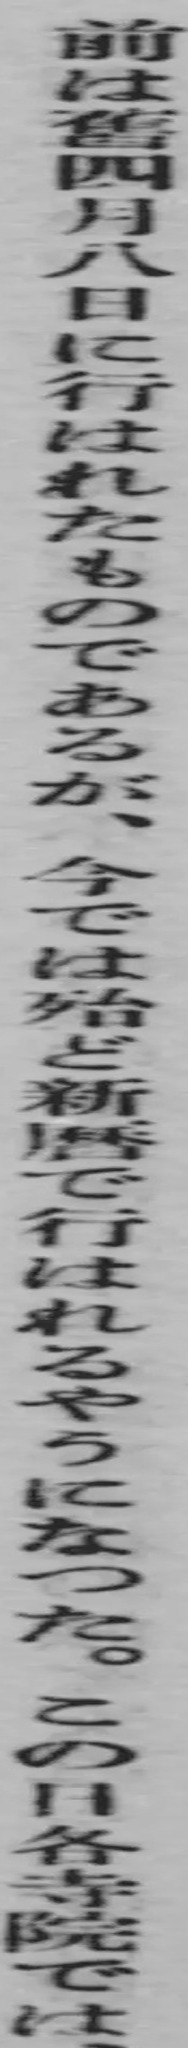前は舊四月八日に行はれたものであるが、今では殆ど新曆で行はれるやうになつた。この日各寺院では、
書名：豊橋の年中行事
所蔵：国立国会図書館 National Diet Library, JAPAN
